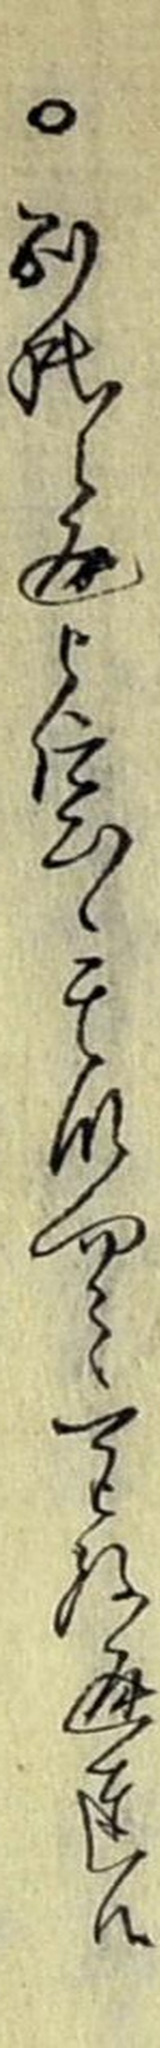○別紙之通被仰出候其段向々へ可被致通達候
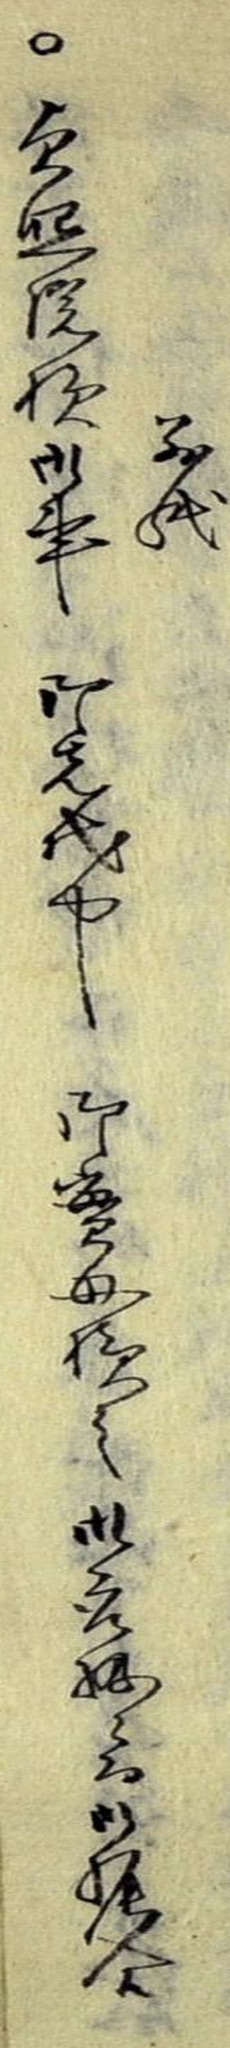○貞照院様御事御先代中御実母様之御取扱ニ而御振合

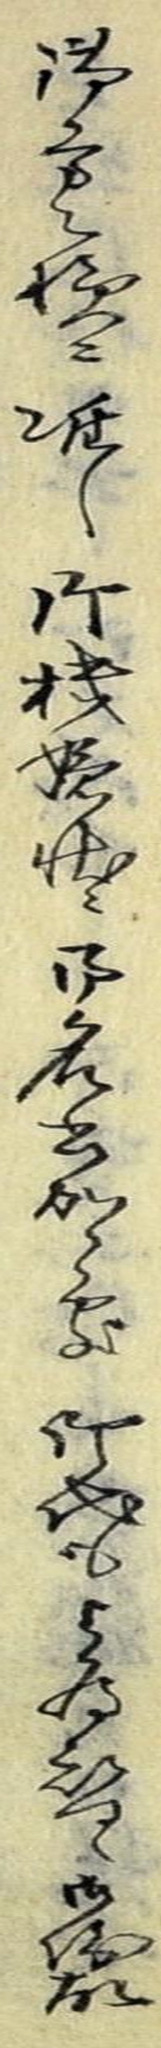御方之様ニ准し御機嫌状ニ御名書加へ候処御代も被為替候御儀故
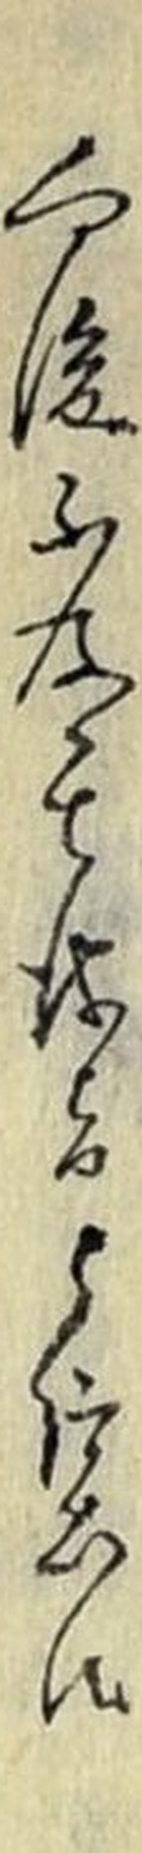向後不及其儀旨被仰出候
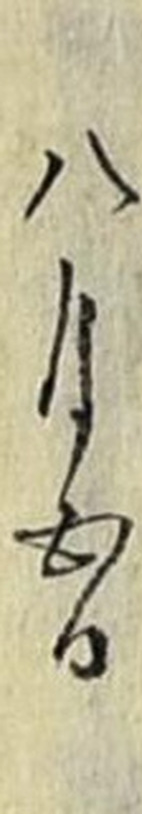八月五日
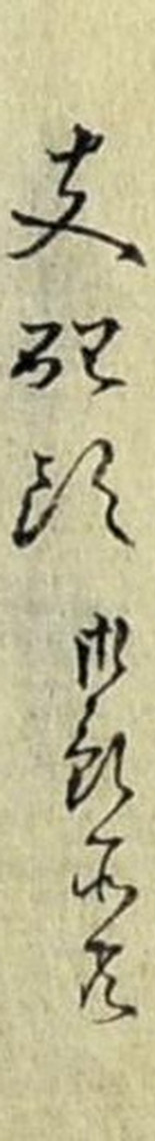支配頭御預所共
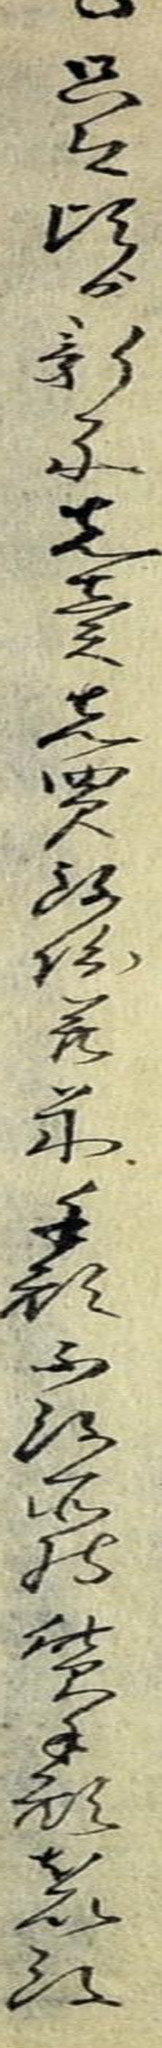○只今頃ゟ新米先売先買致儀并手形不致所持質手形を以致
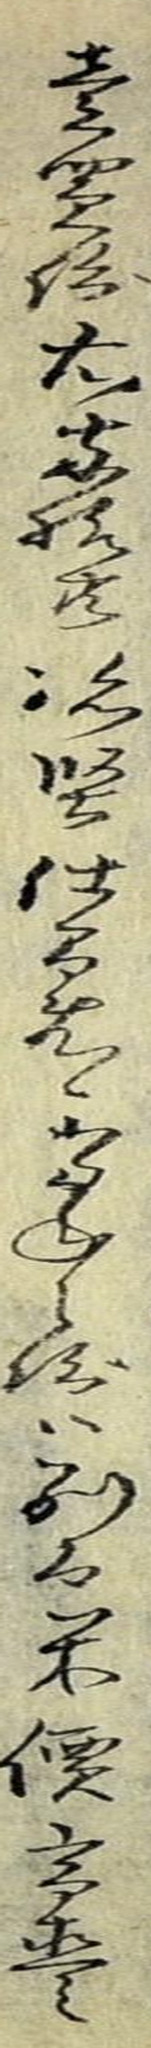売買儀右両様共弥堅仕間敷候当年之儀ハ別而米価高直之
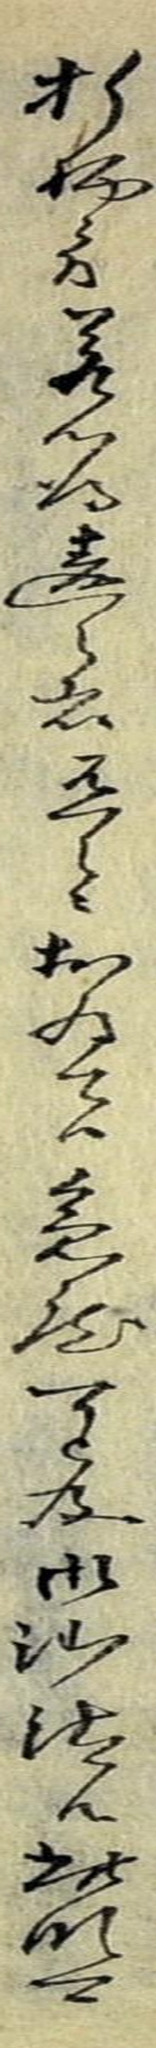折柄ニ付若心得違之者有之ニおゐてハ急度可被及御沙汰候此段可
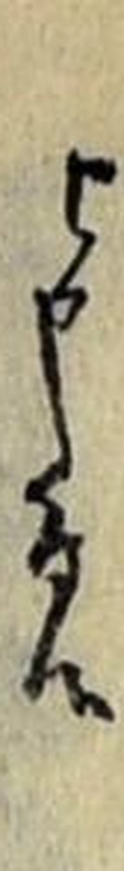被申付候
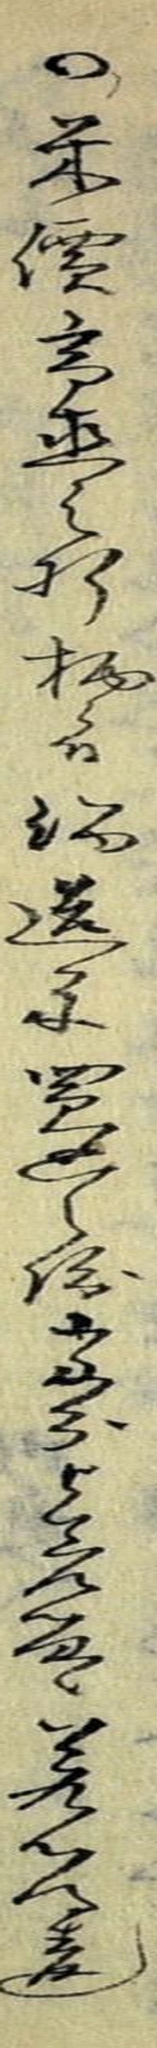○米価高直之折柄ニ付酒造米買込之儀当分被差留候若心得違
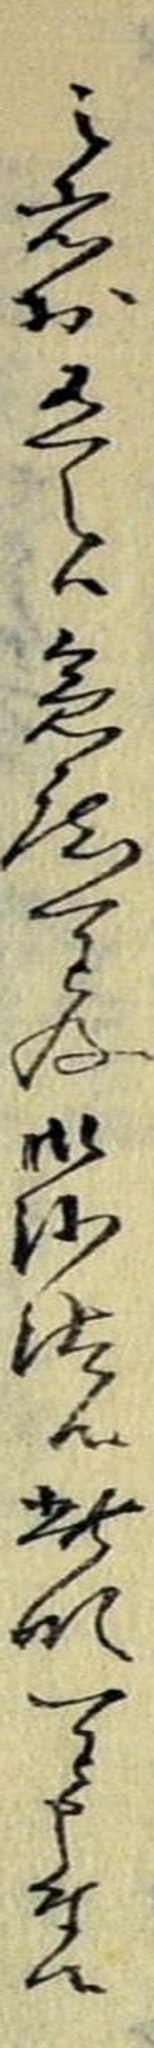之者於有之ハ急度可被及御沙汰候此段可被申付候
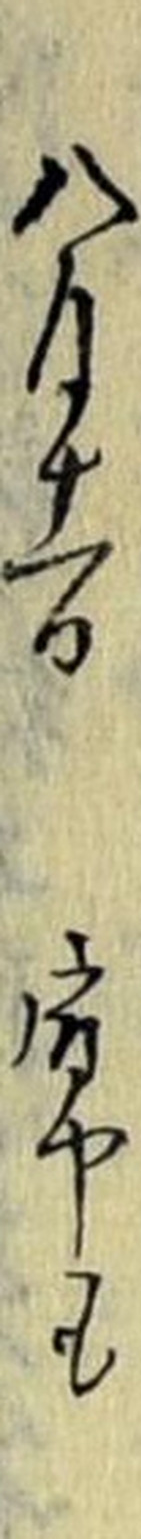八月十一日府中へも
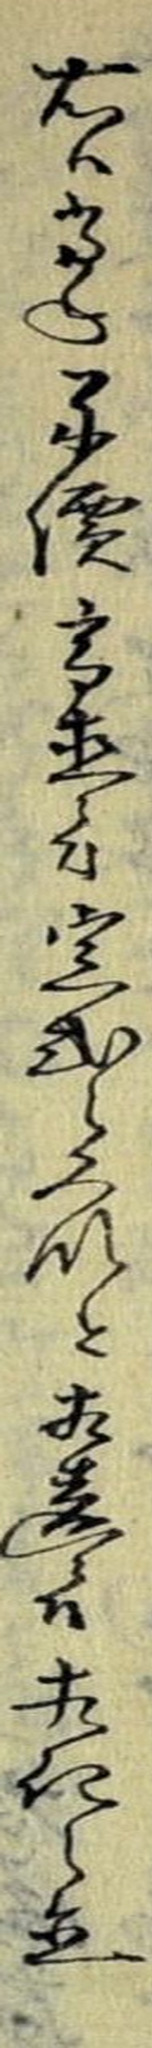右ハ当年米価高直ニ付定式之文段と相違ニ付相記し置
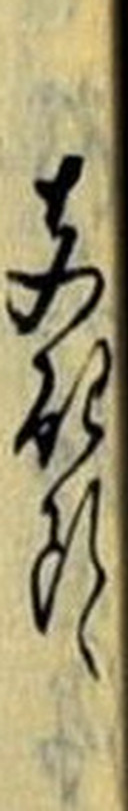支配頭へ
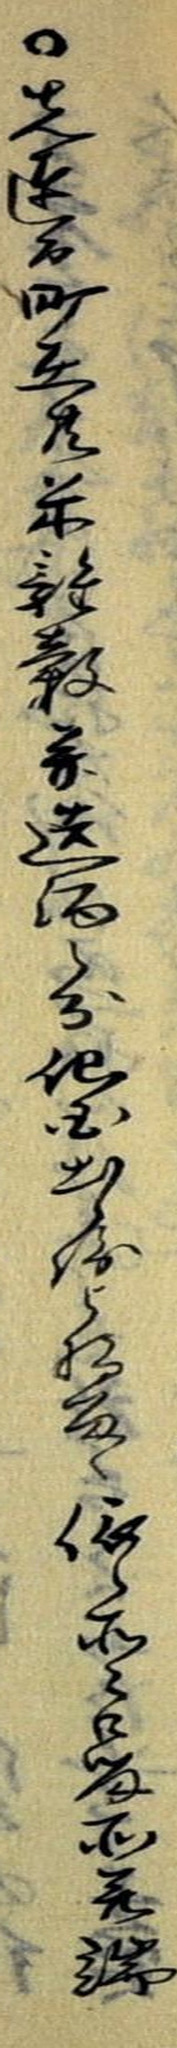○先達而町在共米雑穀并造酒之分他国出之儀被仰指留候依之所々口留所并端
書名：命令之部 五
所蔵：福井県文書館 Fukui Prefectural Archives
